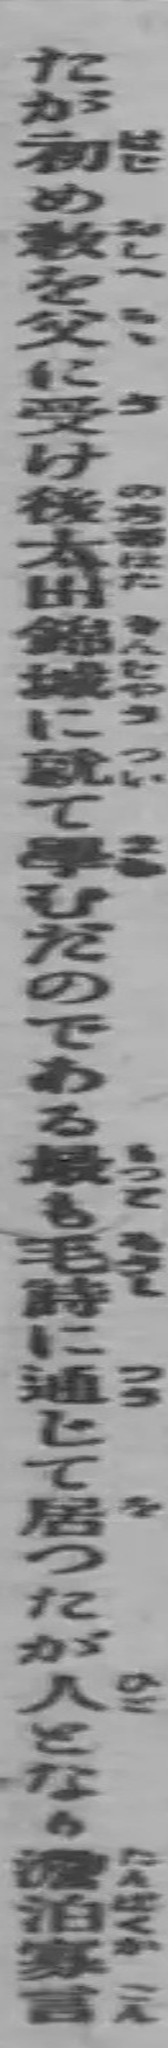たが初め教を父に受け後太田錦城に就て学むだのである最も毛詩に通じて居つたが人となり澹泊寡言

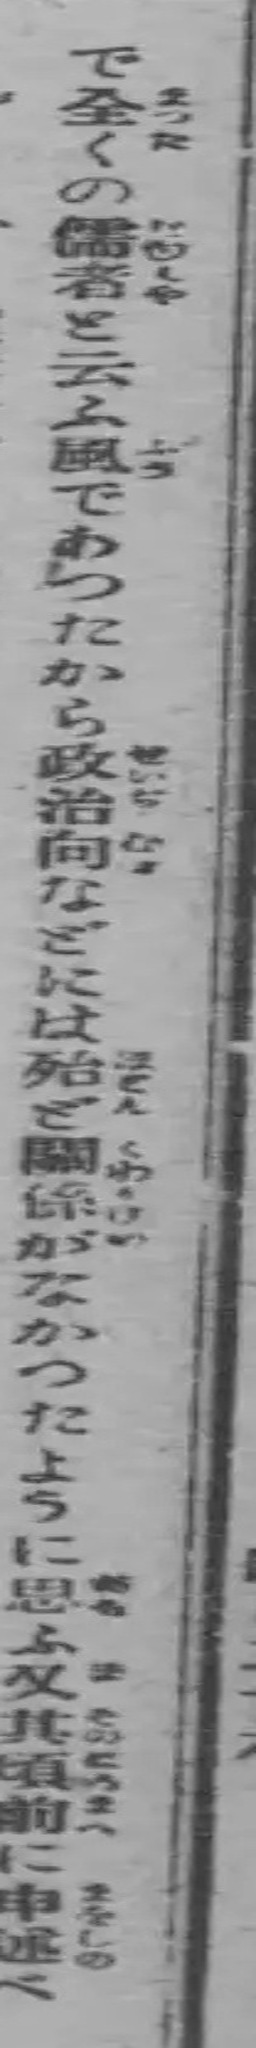で全くの儒者と云ふ風であつたから政治向などには殆ど関係がなかつたように思ふ又其頃前に申述べ
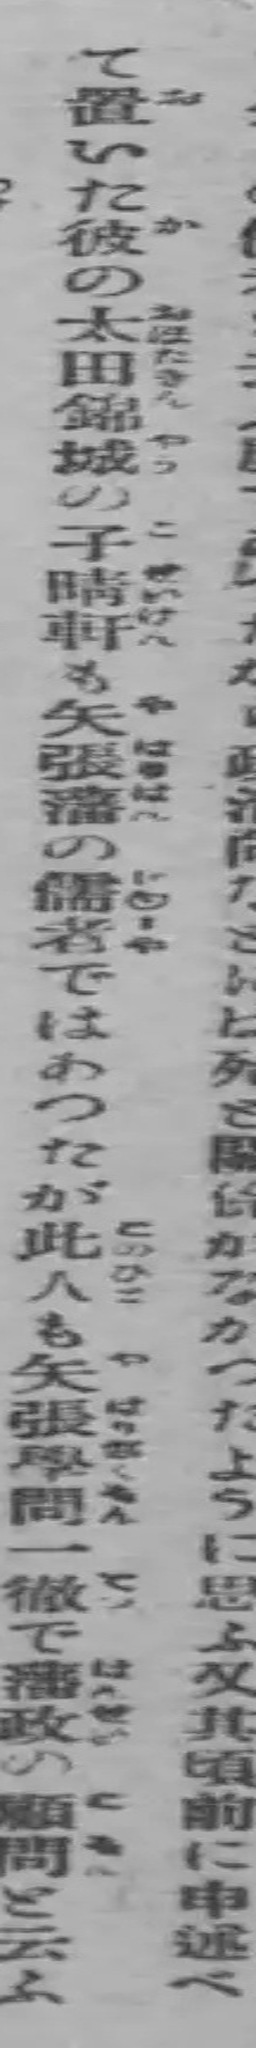て置いた彼の太田錦城の子晴軒も矢張藩の儒者ではあつたが此人も矢張学問一徹で藩政の顧問と云ふ
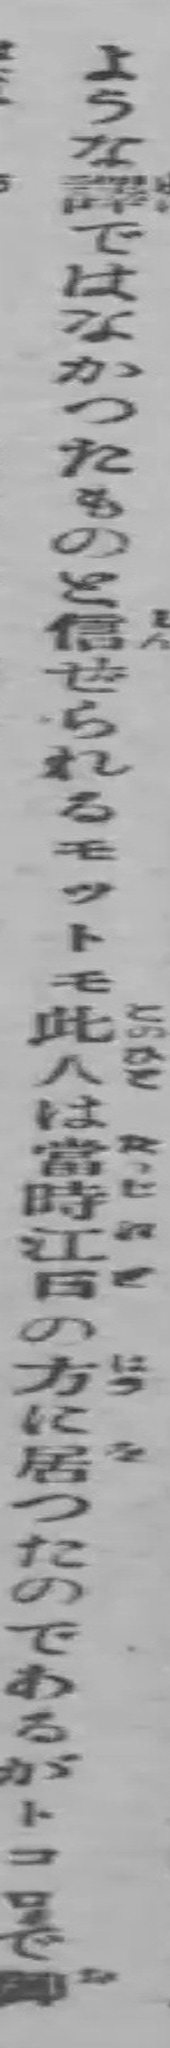ような訳ではなかつたものと信ぜられるモツトモ此人は当時江戸の方に居つたのであるがトコロで御
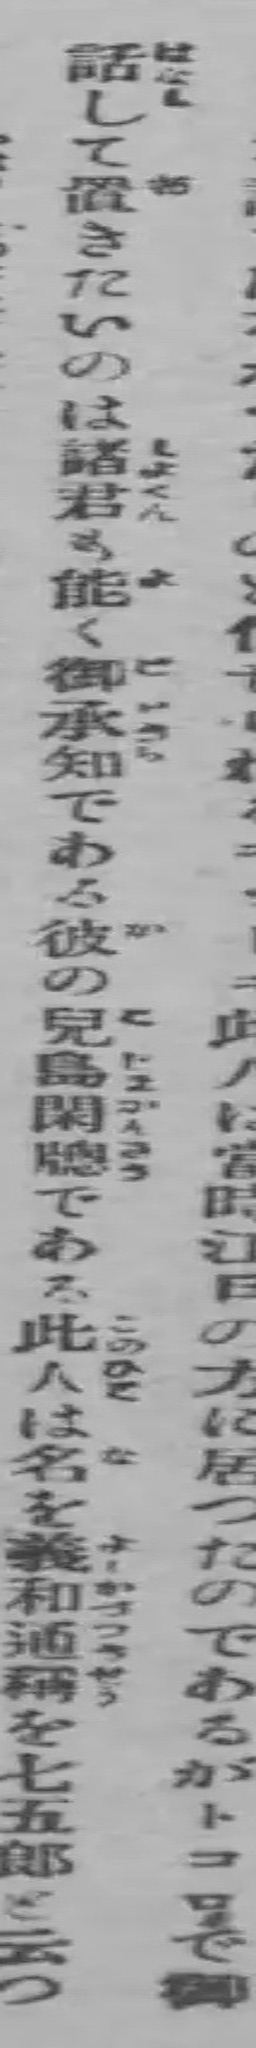児島閑牕話して置きたいのは諸君も能く御承知である彼の児島閑牕である此人は名を義和通称を七五郎と云つ
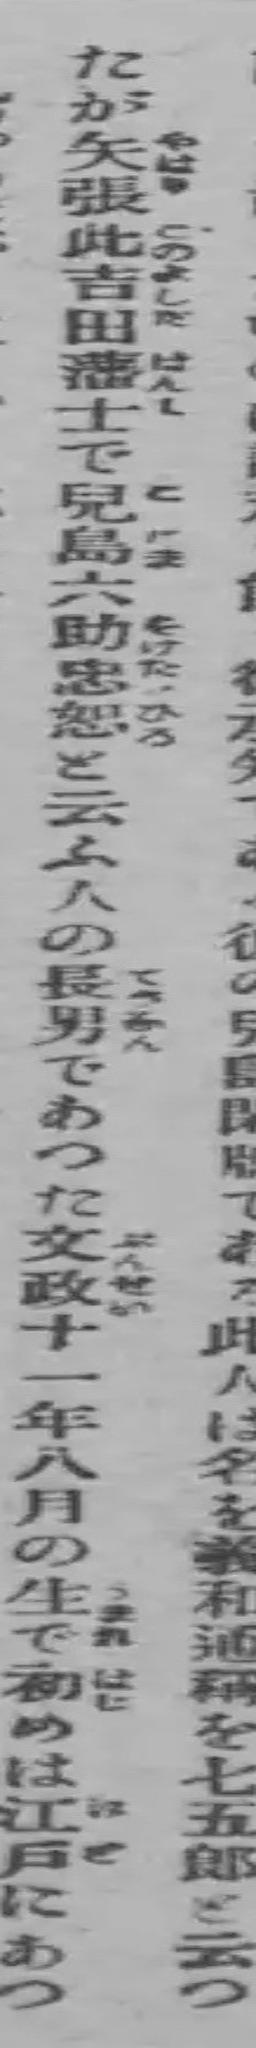たが矢張此吉田藩士で児島六助忠恕と云ふ人の長男であつた文政十一年八月の生で初めは江戸にあつ
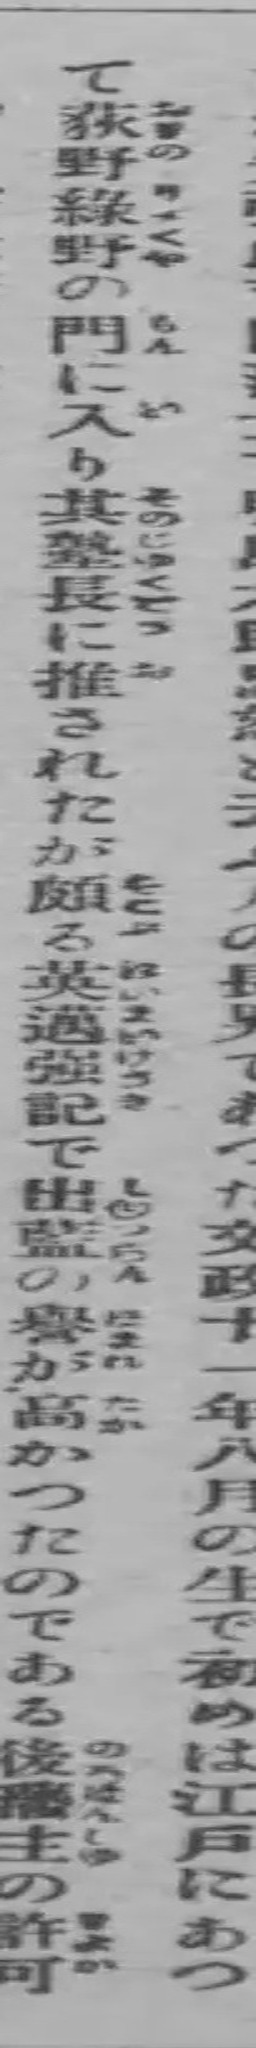て荻野緑野の門に入り其塾長に推されたが頗る英邁強記で出藍の誉が高かつたのである後藩主の許可
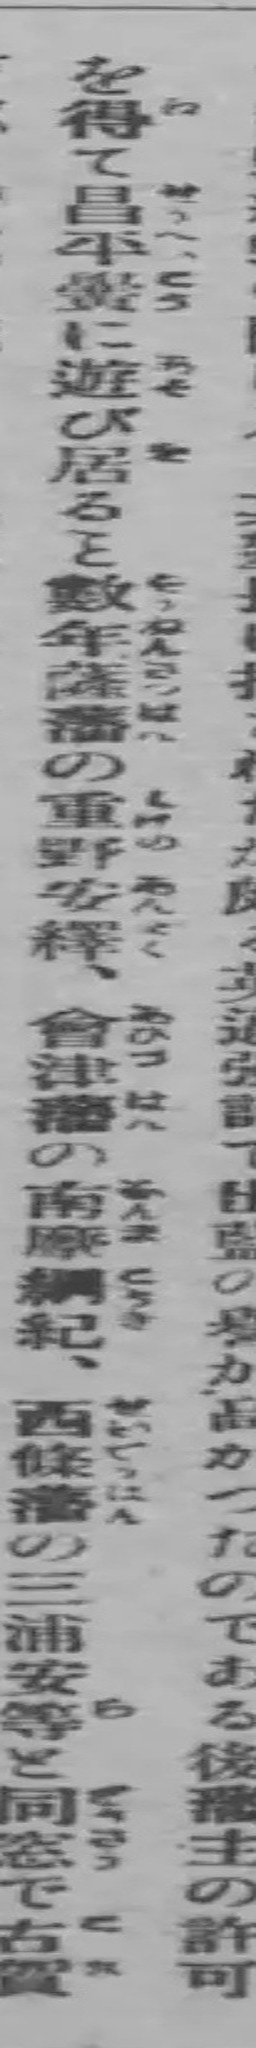を得て昌平黌に遊び居ること数年薩藩の重野安繹、会津藩の南摩綱紀、西條藩の三浦安等と同窓で古賀
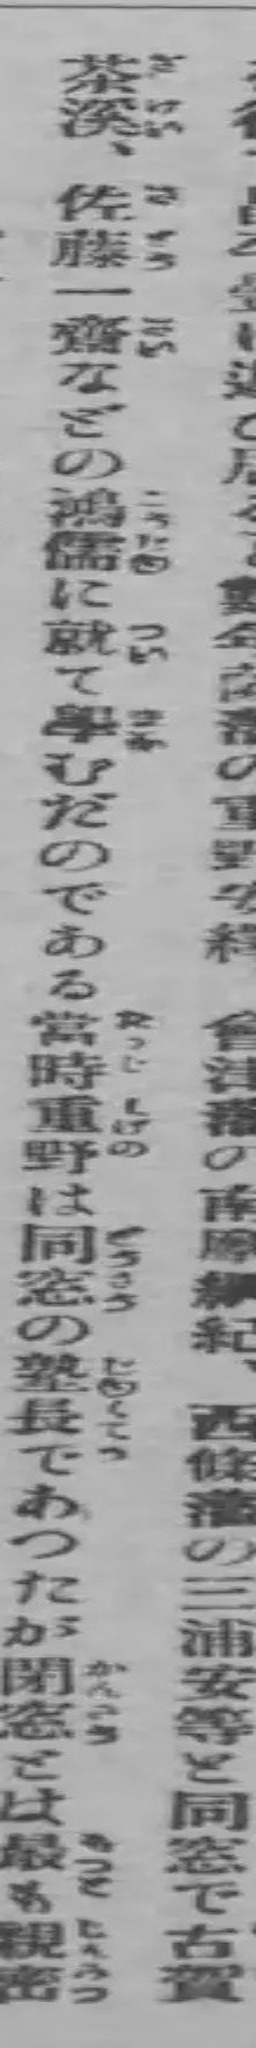茶渓、佐藤一斉などの鴻儒に就て学むだのである当時重野は同窓の塾長であつたが閉窓とは最も親密
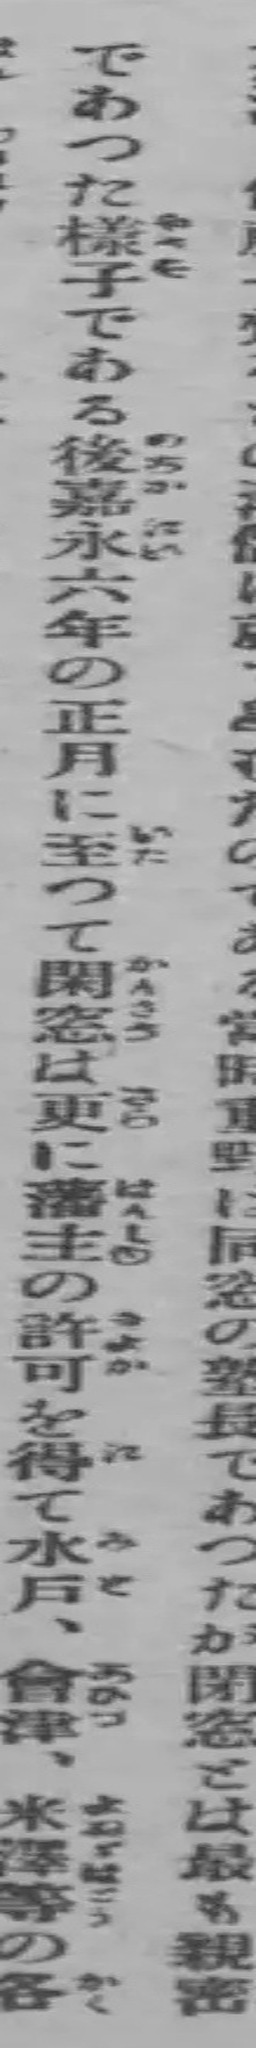であつた様子である後嘉永六年の正月に至つて閑窓は更に藩主の許可を得て水戸、会津、米沢等の各
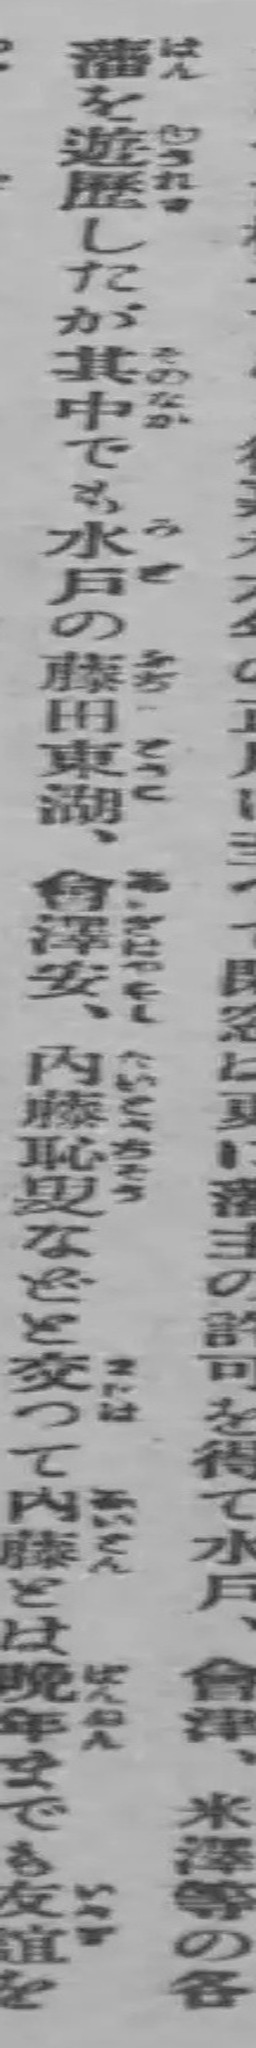藩を遊歴したが其中でも水戸の藤田東湖、会沢安、内藤恥叟などと交つて内藤とは晩年までも友誼を
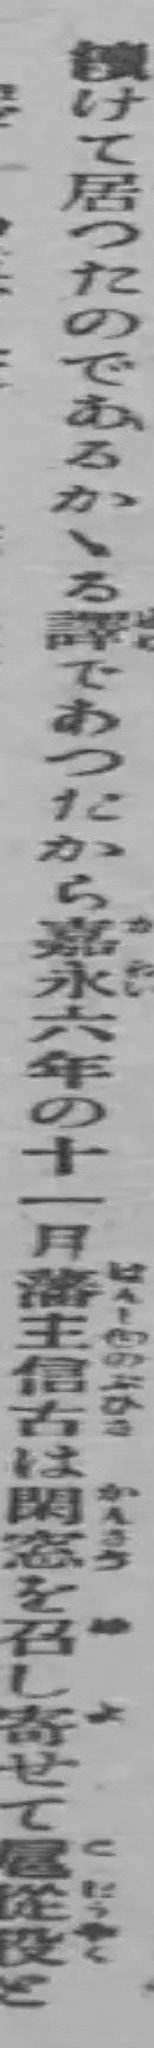続けて居つたのであるかゝる訳であつたから嘉永六年の十一月藩主信古は閑窓を召し寄せて扈従役と
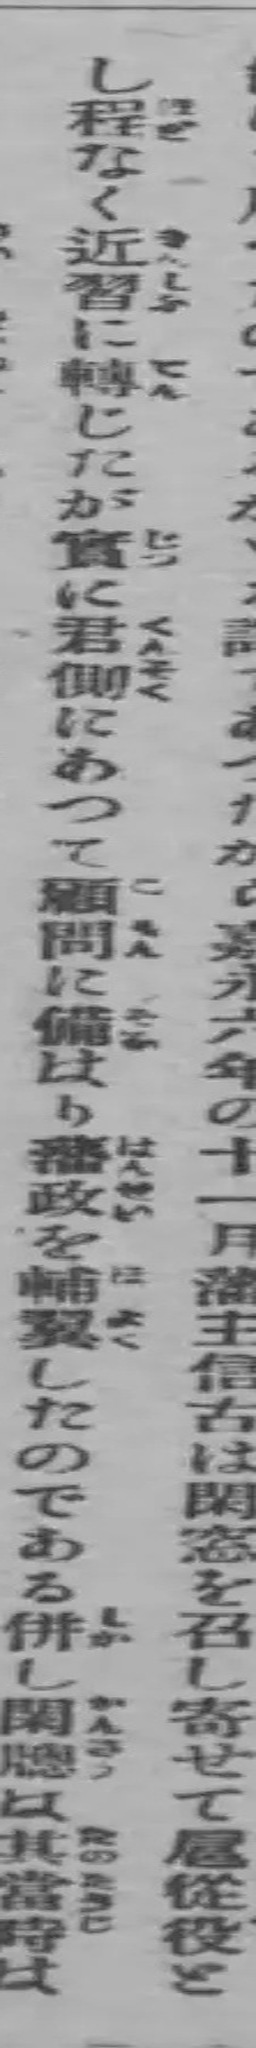し程なく近習に転じたが実に君側にあつて顧問に備はり藩政を輔翼したのである併し閑牕は其当時は
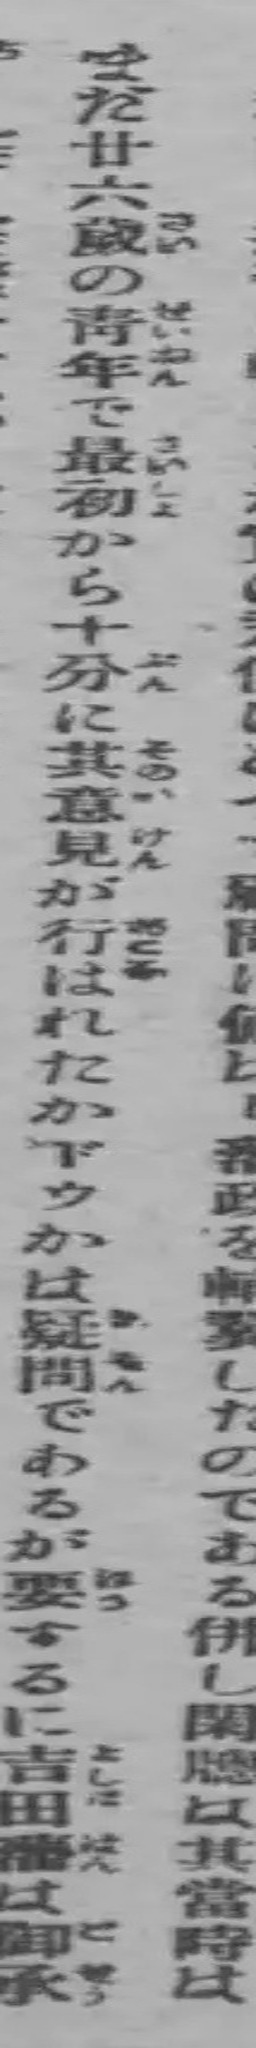まだ廿六歳の青年で最初から十分に其意見が行はれたかドウかは疑問であるが要するに吉田藩は御承
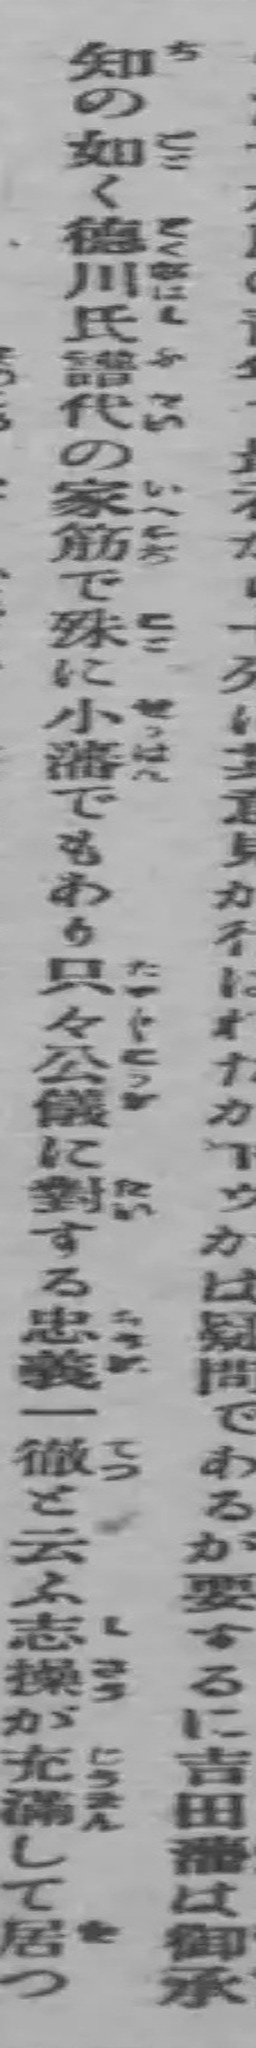知の如く徳川氏譜代の家筋で殊に小藩でもあり只々公儀に対する忠義一徹と云ふ志操が充満して居つ
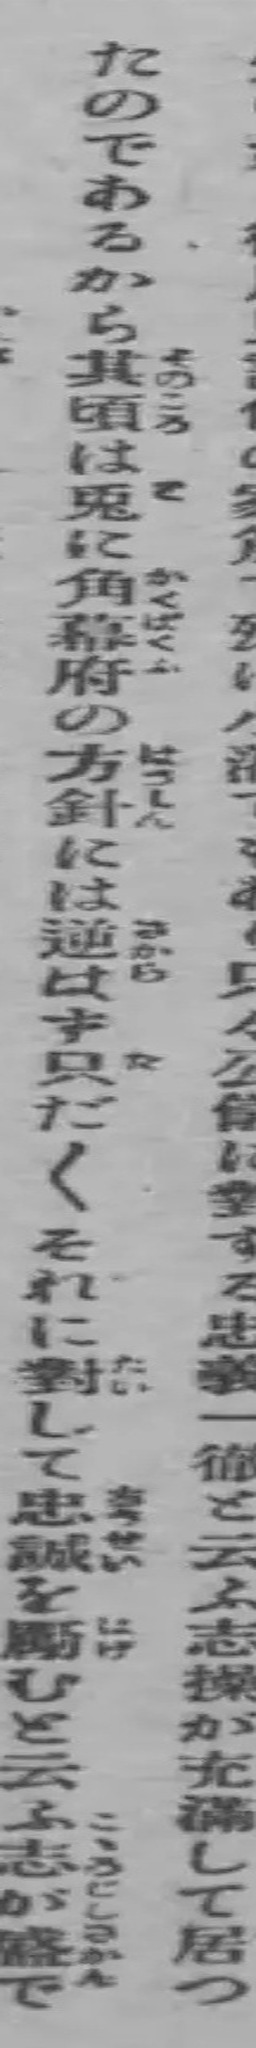たのであるから其頃は兎に角幕府の方針には逆はず只だ〳〵それに対して忠誠を励むと云ふ志が盛で
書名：豊橋市史談
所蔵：国立国会図書館 National Diet Library, JAPAN
